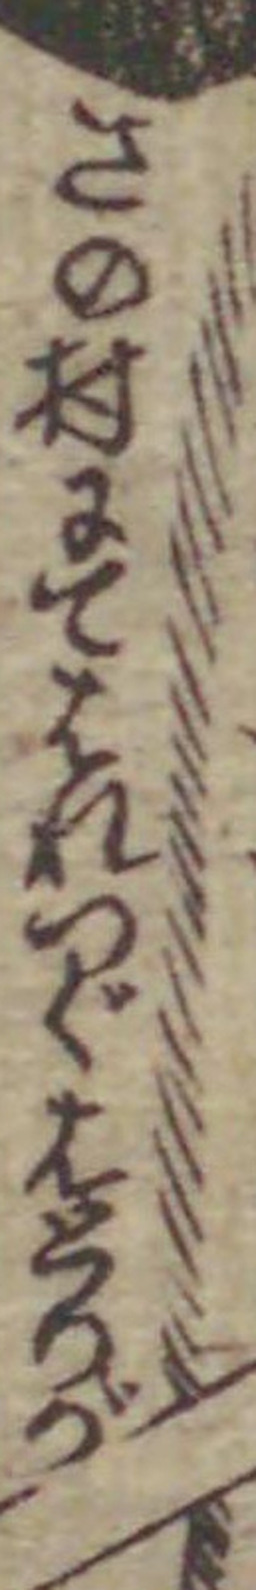さの村にてはれつぐはとりが
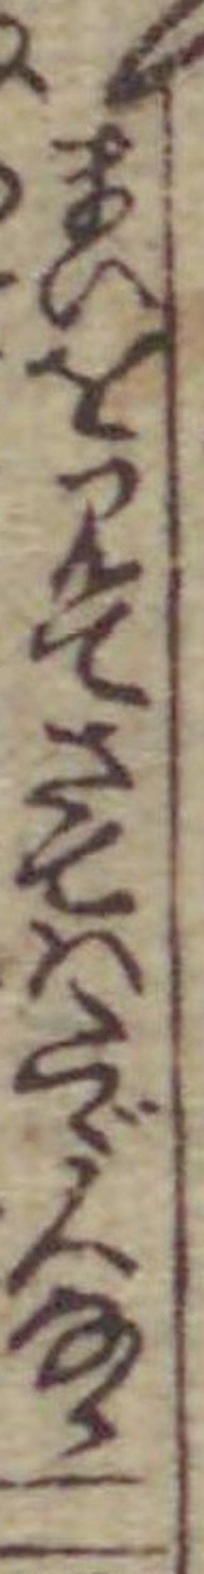まいを見てさてはたゞ人なら
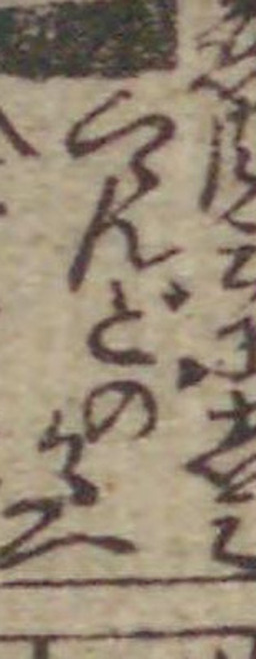くらんどのかたへ
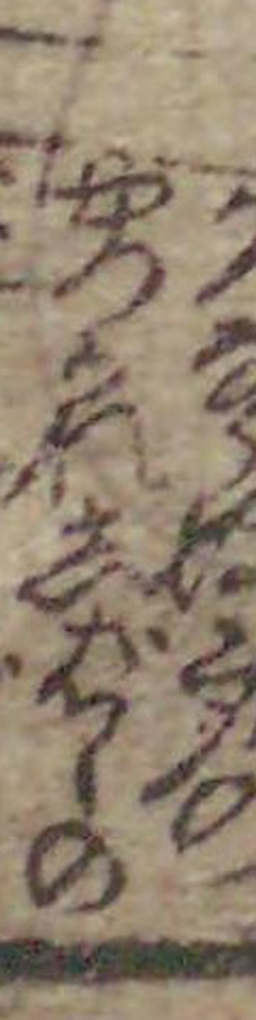やつかれしばしの
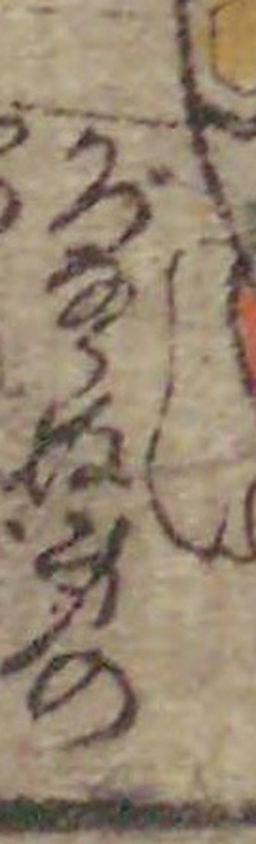かづならぬ身の
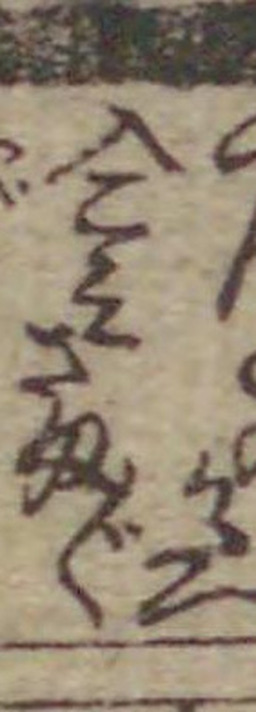入こみさま〴〵
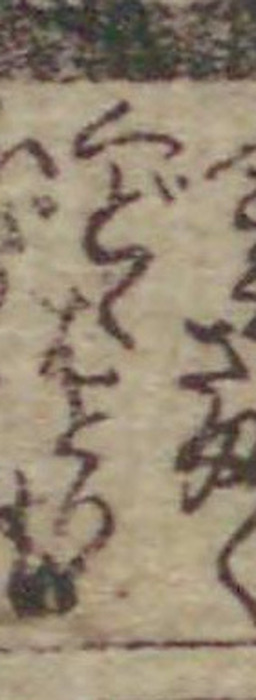くどくはとり
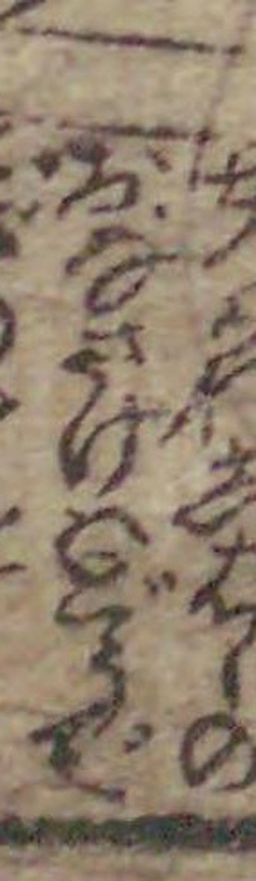おなさけはどうで
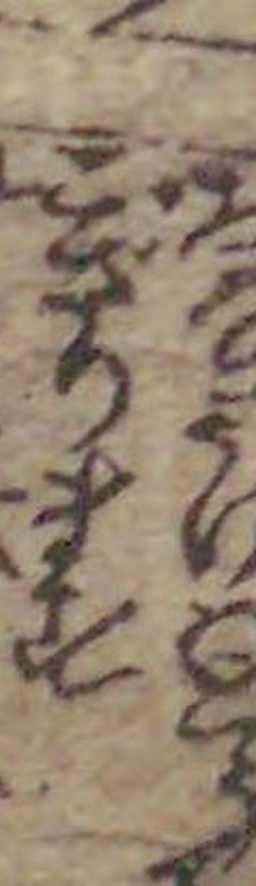ござります
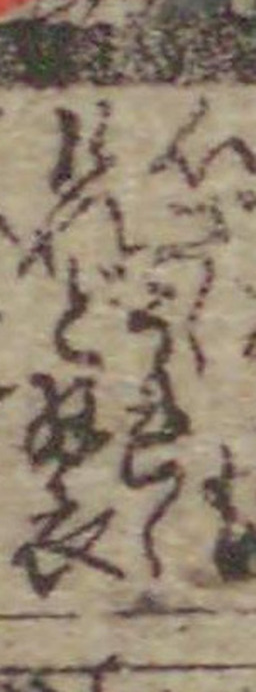けれど羽衣
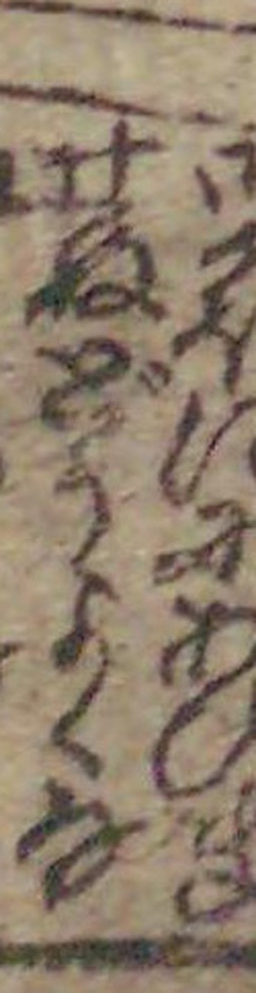せぬどうよくな
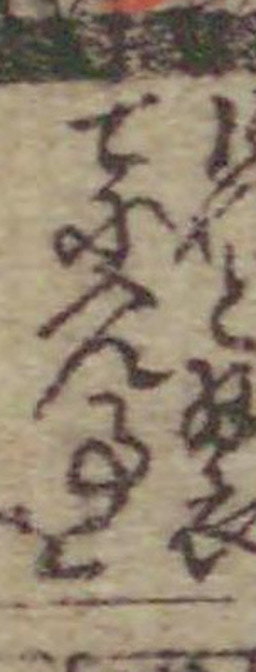てに入ん事を
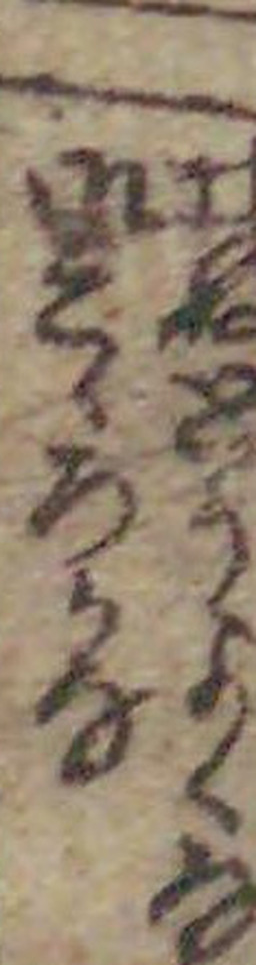御こくあかな

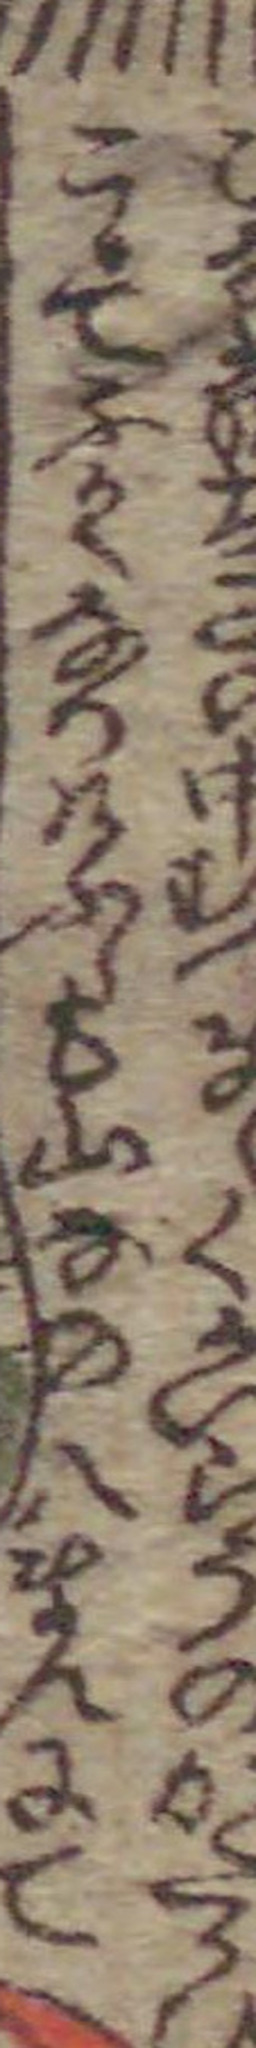こしてふかくなりけふしも山なの八まんにて出あひ
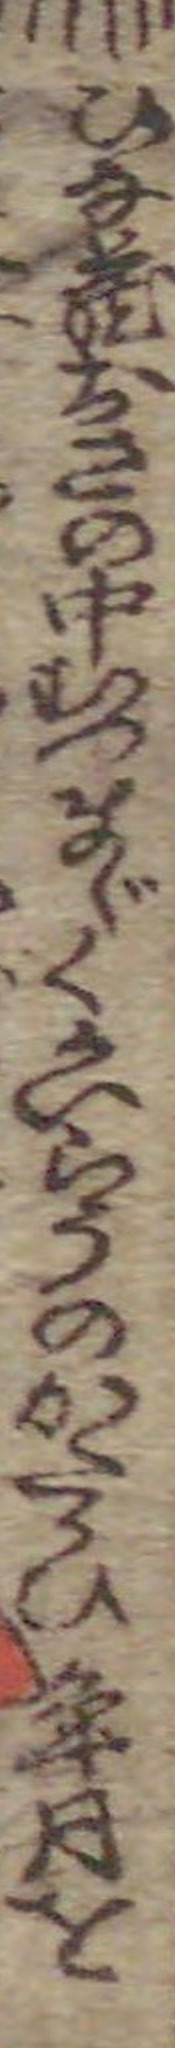ひな蔵おさの中むつまじくかいらうのかたらひ年月を
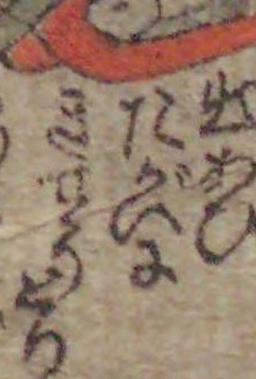たがいに
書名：娜二代鉢木 5巻
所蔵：国立国会図書館 National Diet Library, JAPAN
